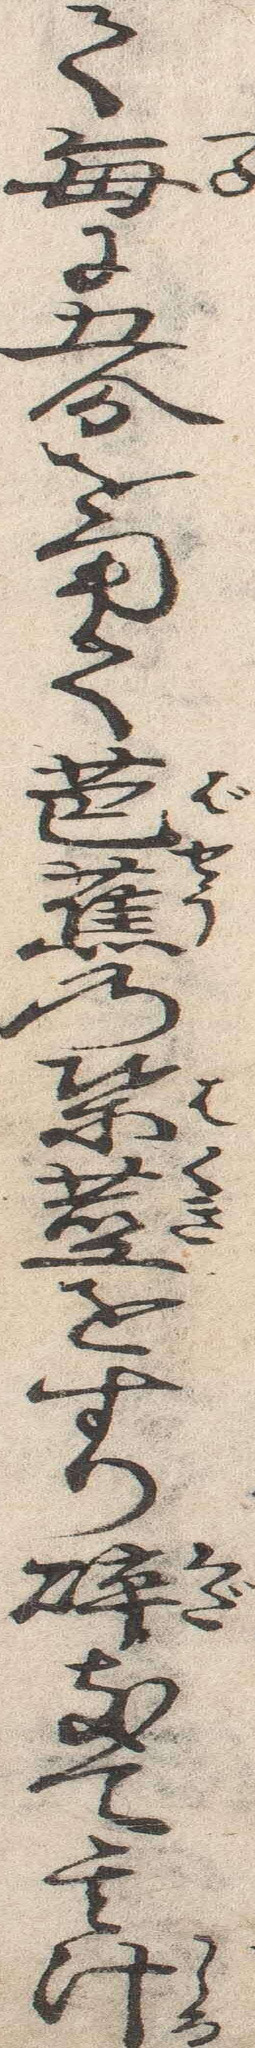て毎に五分を用て芭蕉の葉茎をすり砕きて其汁
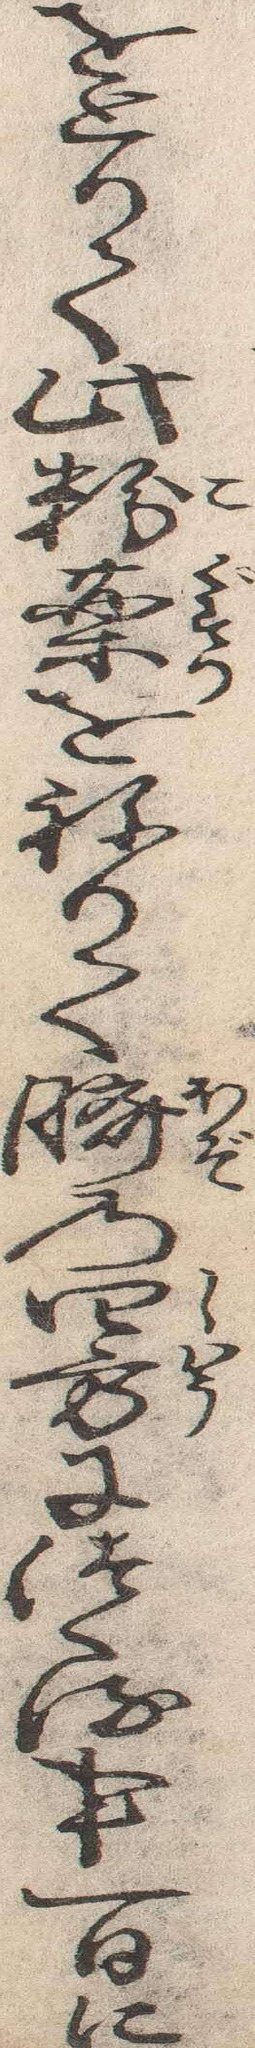をとりて此粉薬をねりて臍の四方につくる事一日に
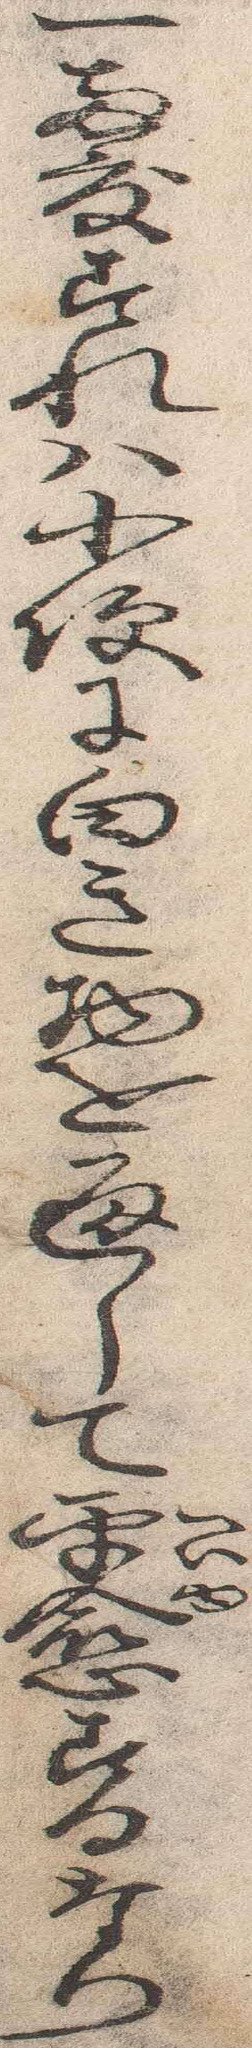一両度すれは小便に白き物を通して平愈するなり

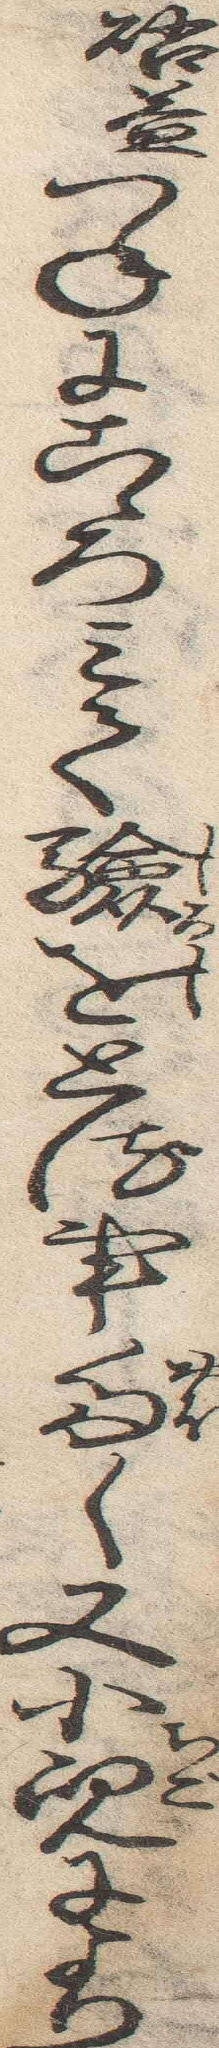啓益つねにこゝろみて験をとる事多し又小児により
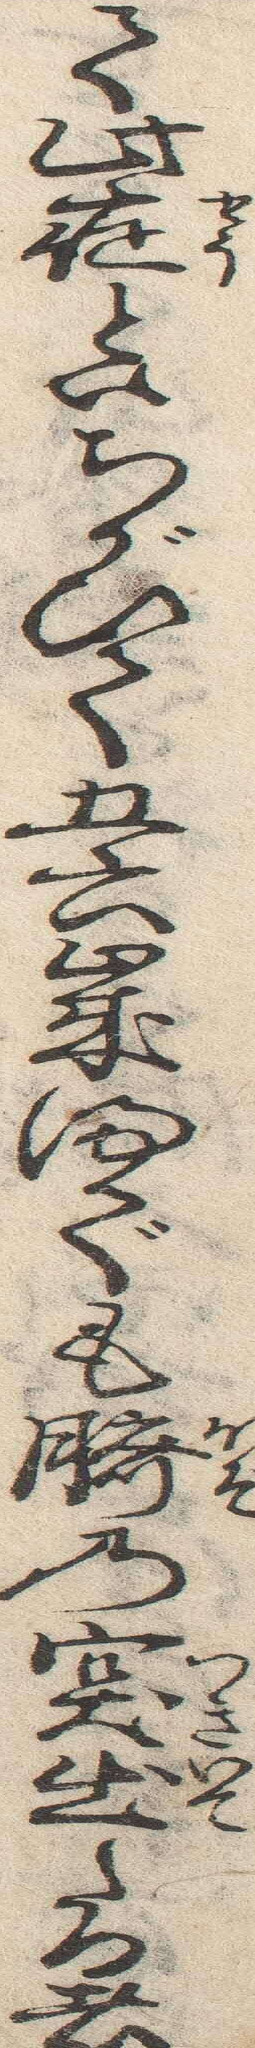て此症とはちがひて五六歳までも臍の突出たる者
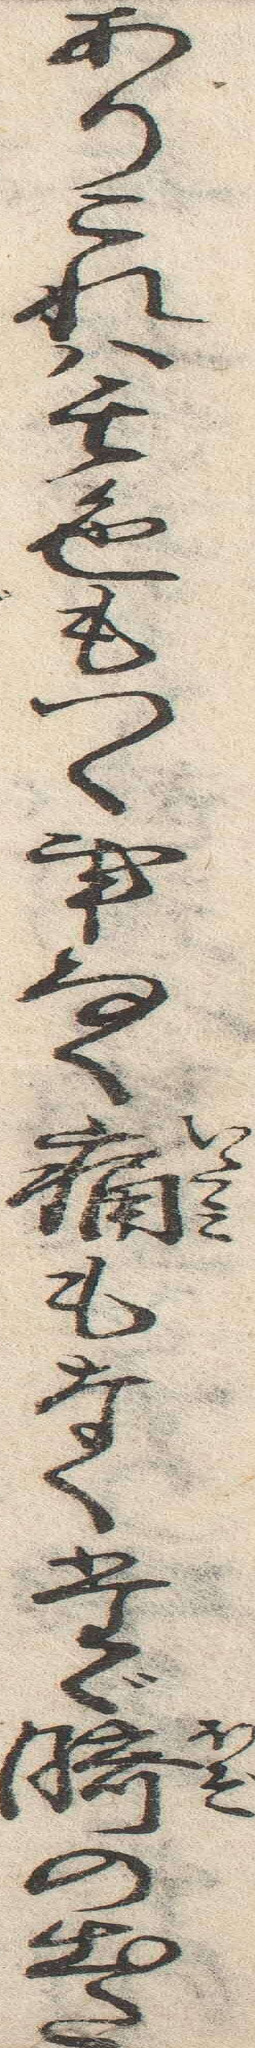ありこれは其色もつく事なく痛もなくたゞ臍の出た
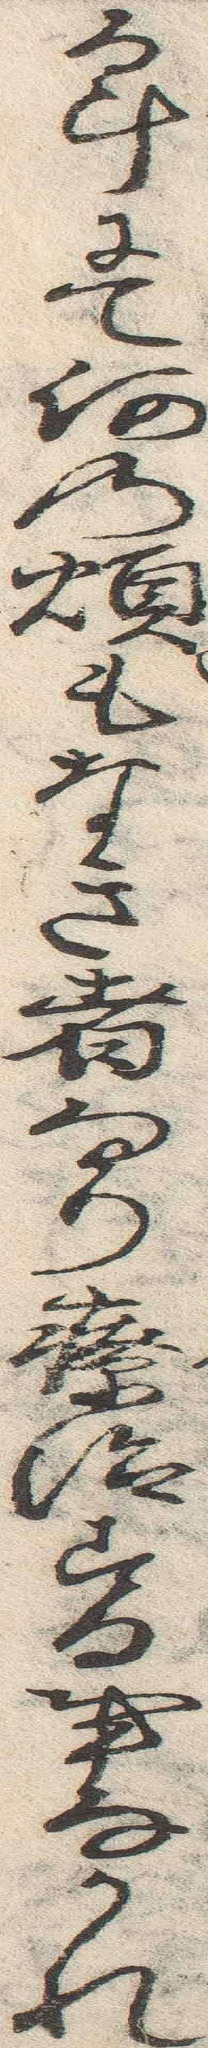る計にて何の煩もなき者なり療治する事なかれ
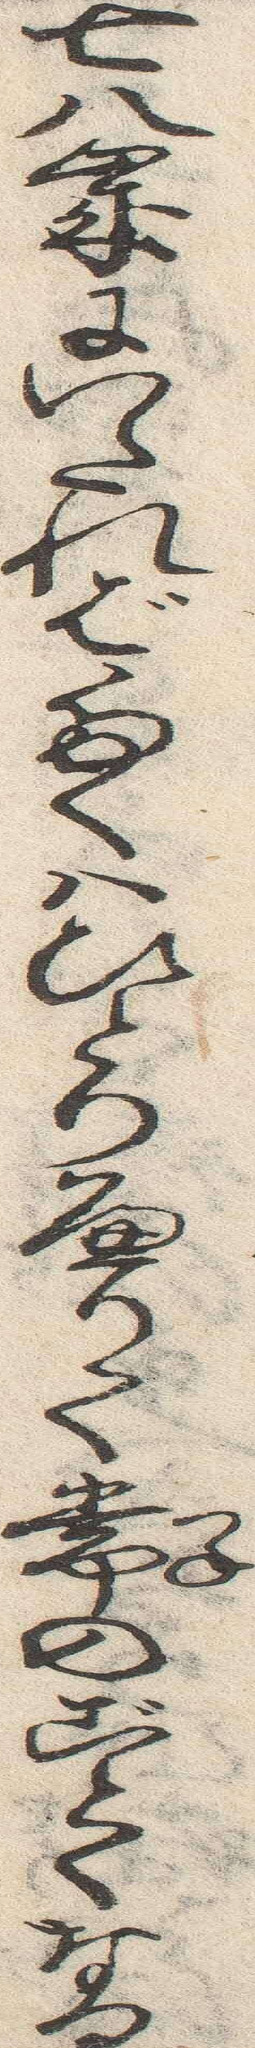七八歳にいたれば多くはひとりへりて常のごとくなる
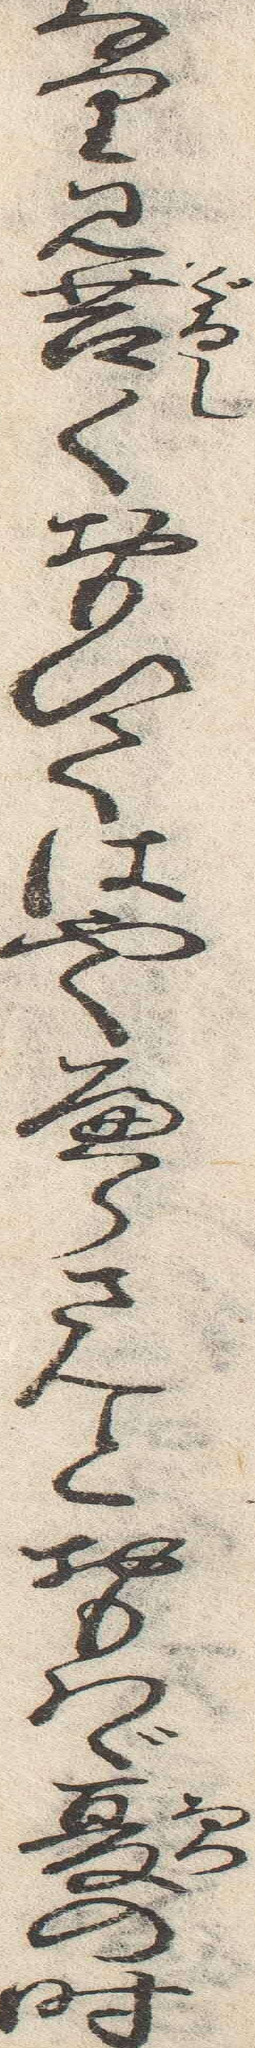なり見苦くおもひてはやくへらさんとおもはゞ夏の時
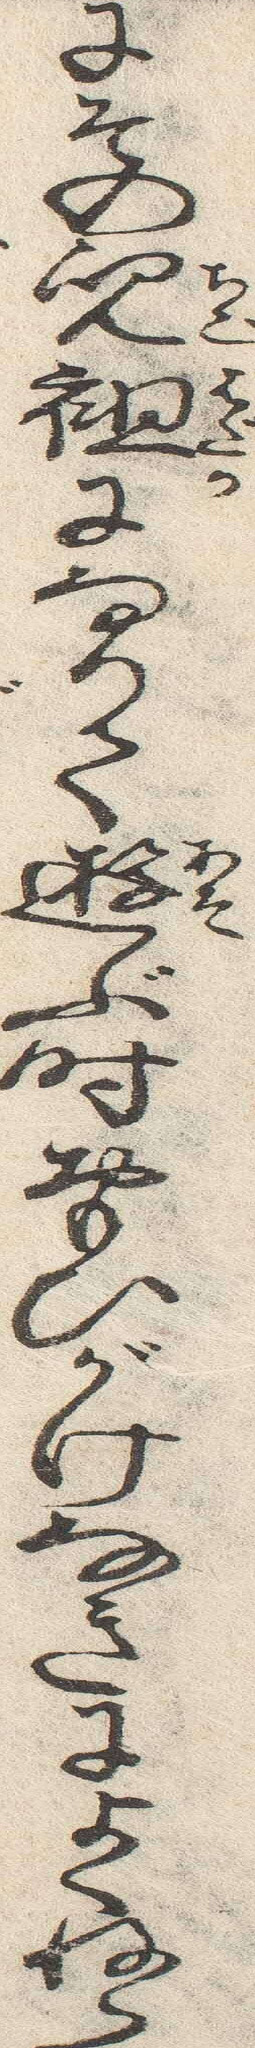にその児袒になりて遊ぶ時おもひがけなきによくねら
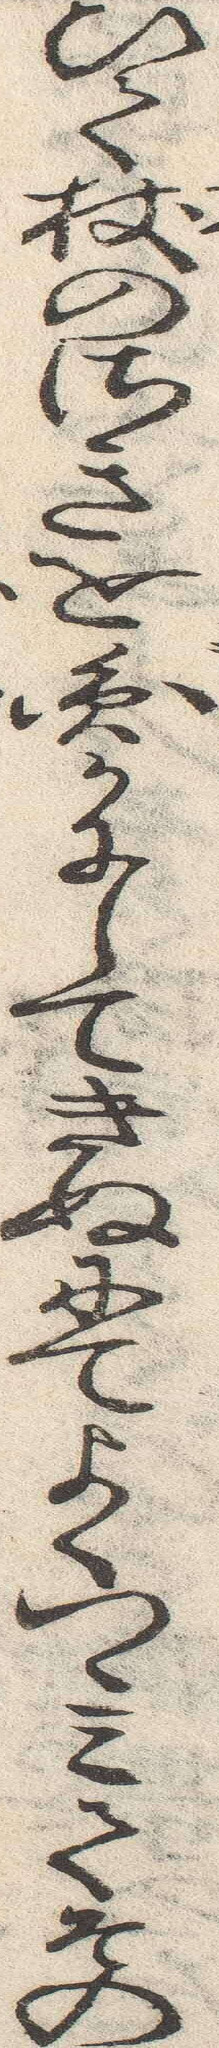ひて杖のさきを円かにしてきぬにてよくつゝみてその
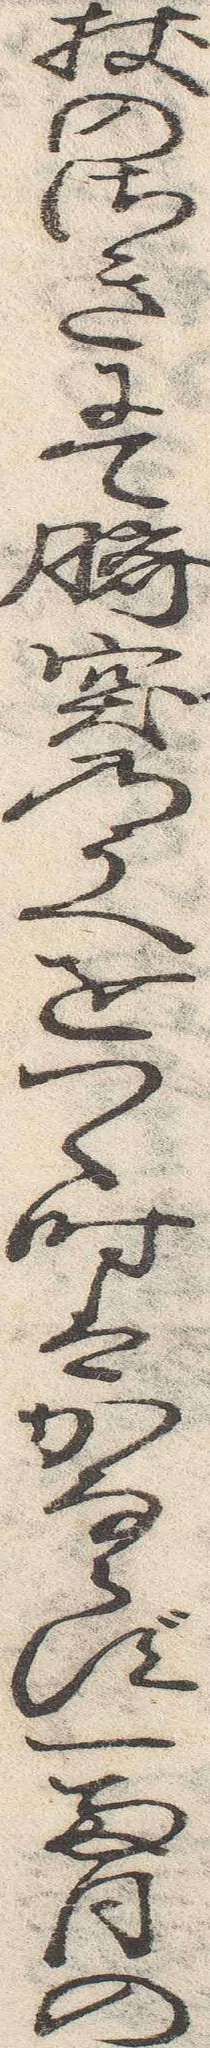杖のさきにて臍突のうへをつく時はかならず一両月の
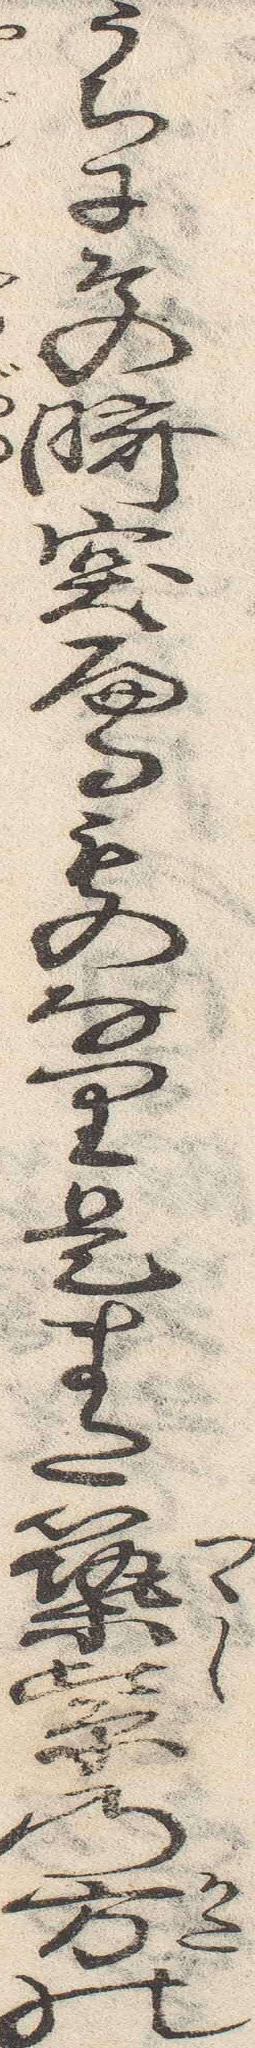うちにその臍突へるものなり是また築紫の方の
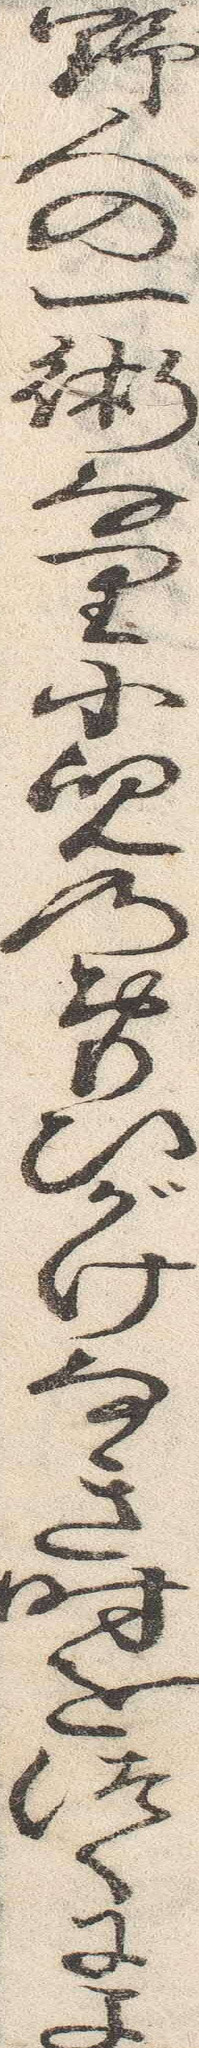野人の一術なり小児のおもひがけなき時をつくによ
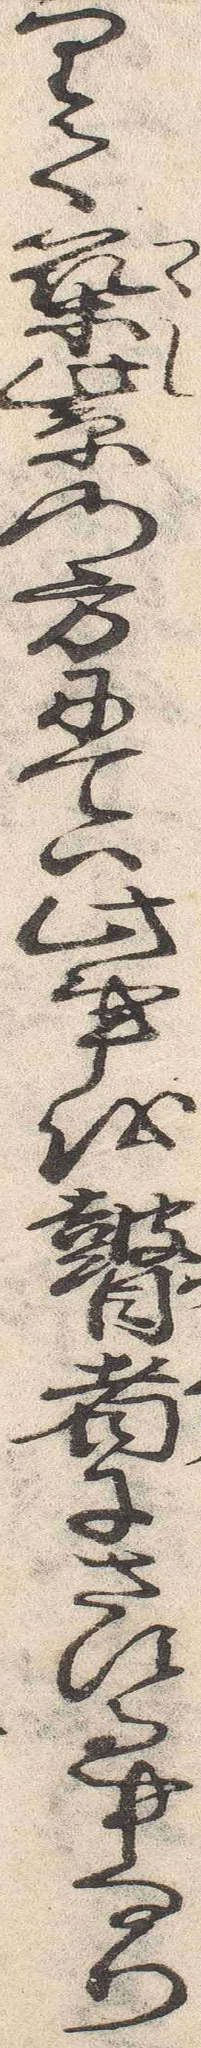りて築紫の方にては此事を瞽者にさする事なり
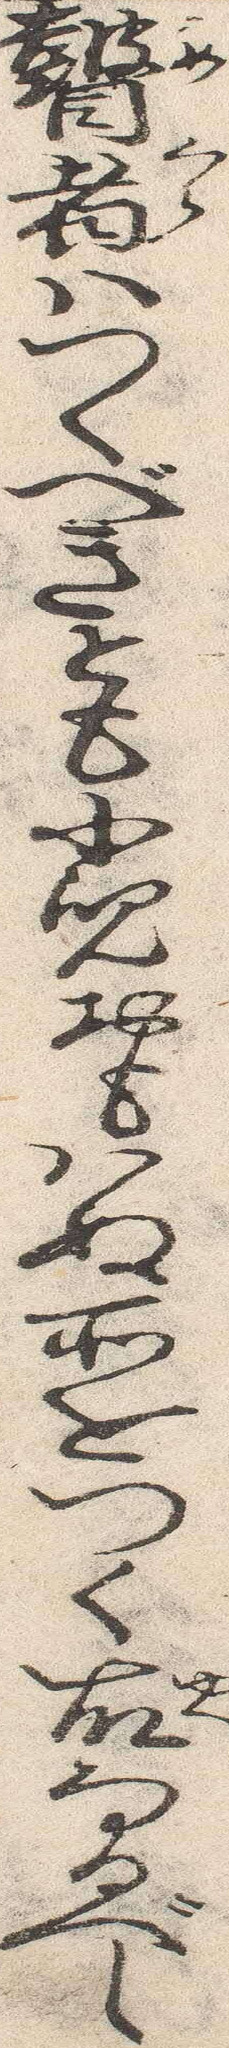瞽者はつくべきとも小児おもはぬ所をつく故なるべし
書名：小児必用養育草
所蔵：東京学芸大学附属図書館 国文学研究資料館
